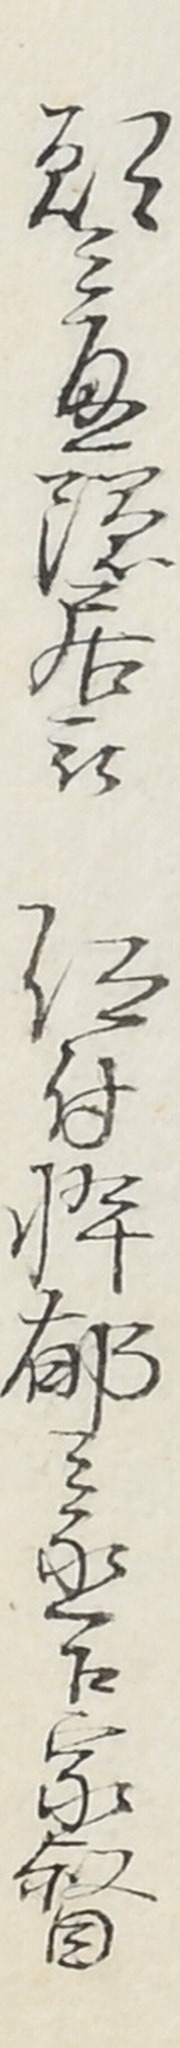願之通隠居被仰付伜郁之丞江家督
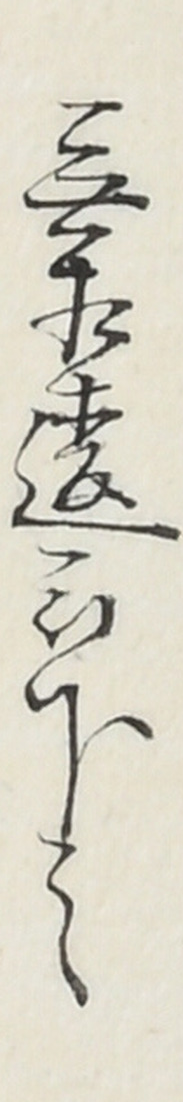無相違被下之

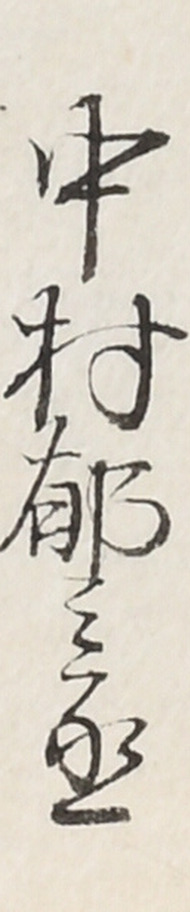中村郁之丞
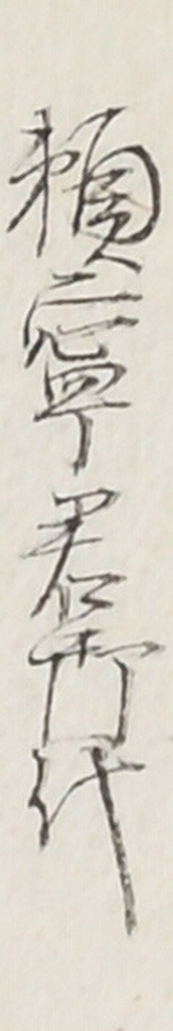頼寧君御代
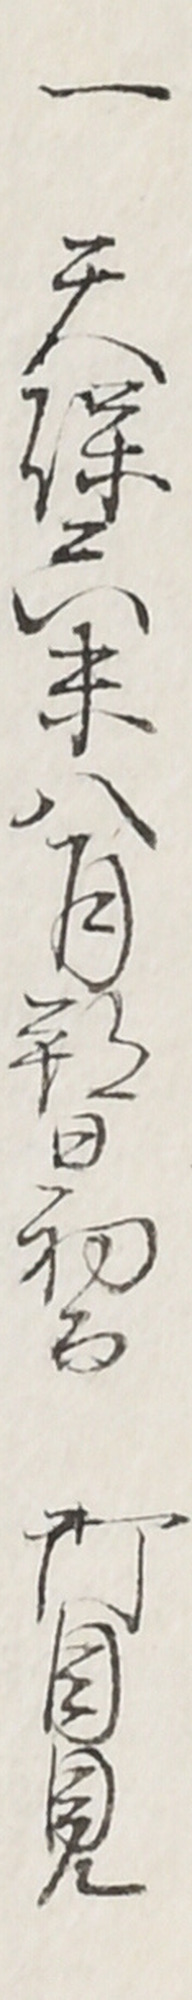一天保六未八月朔日初而御目見
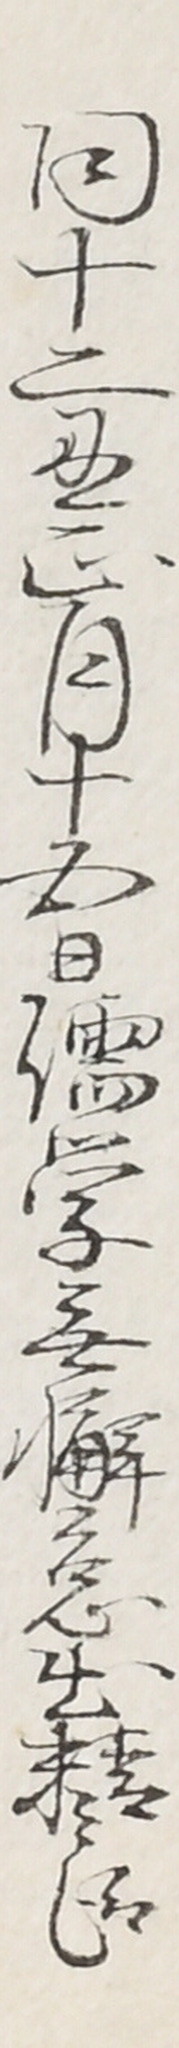一同十二丑正月十五日儒学無懈怠出精之趣
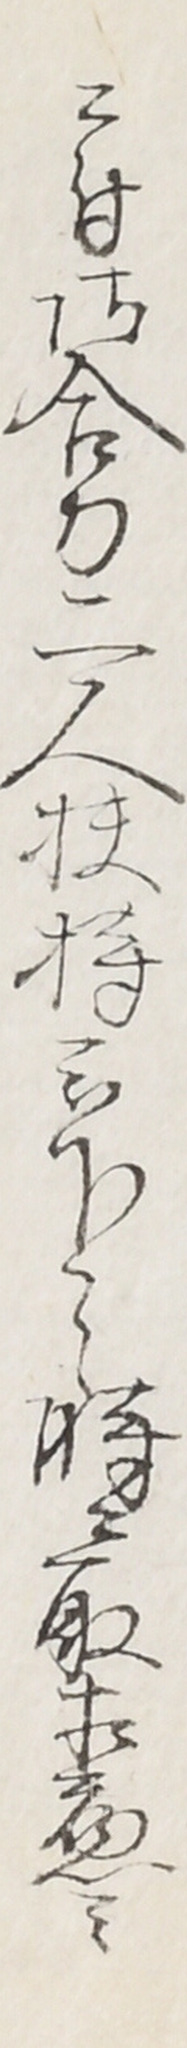ニ付御合力二人扶持被下之時ニ取相応之
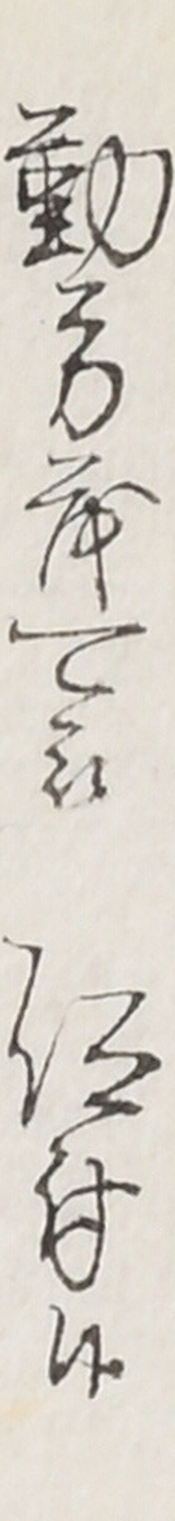勤方も可被仰付候
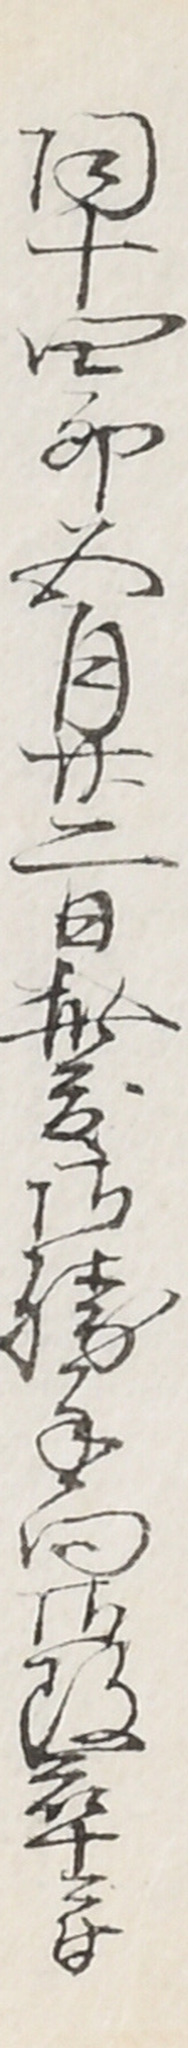一同十四卯五月廿二日此度御勝手向御改革ニ付
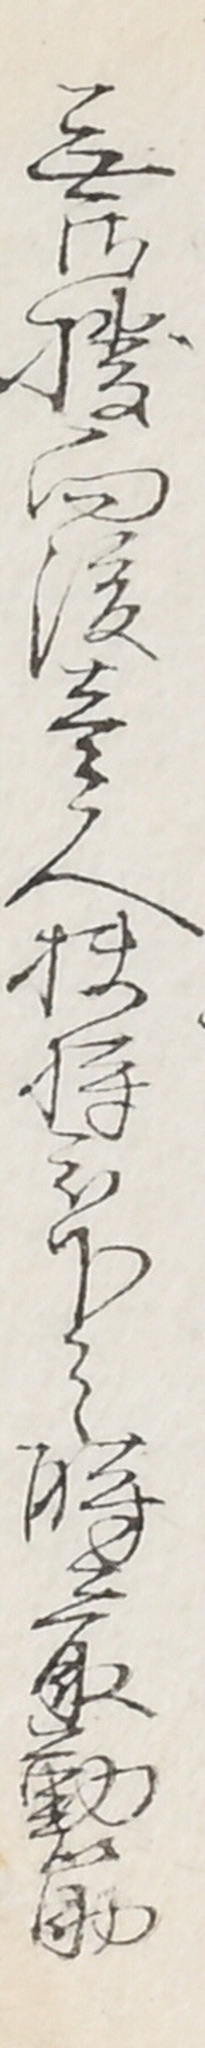無御拠向後壱人扶持被下之時ニ取勤筋
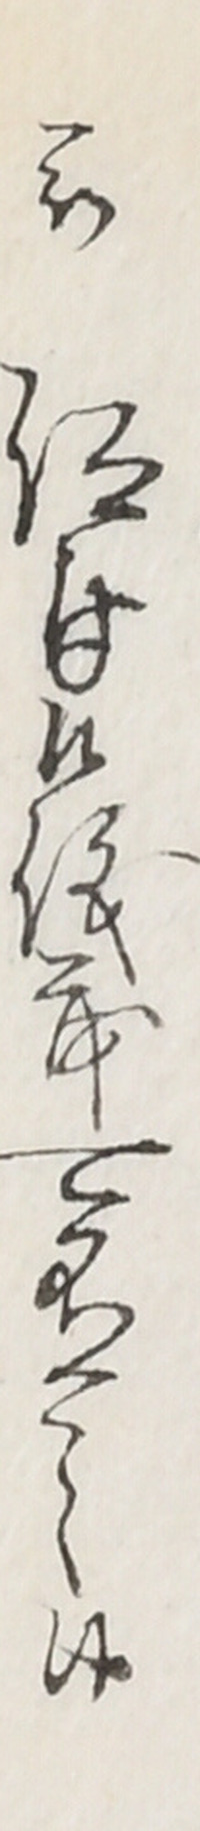被仰付候儀も可有之候
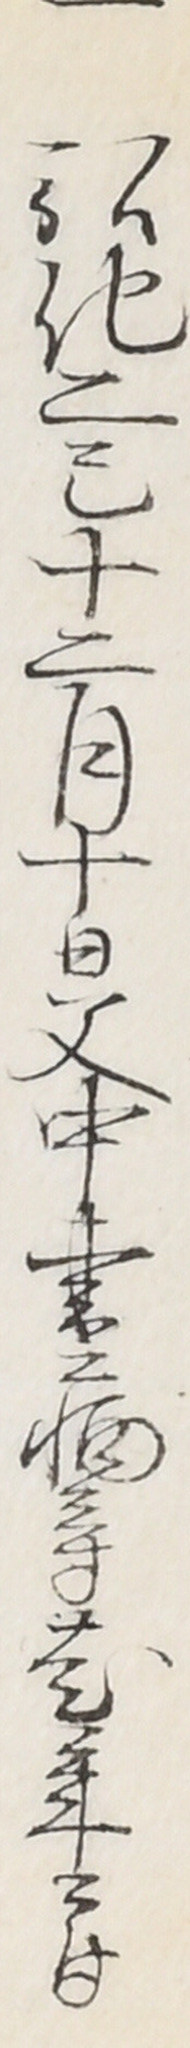一弘化二巳十二月十日父中書病気老年ニ付
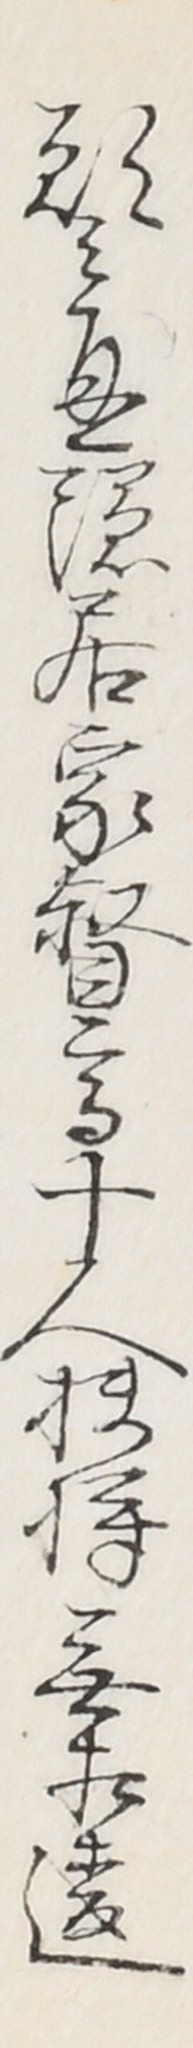願之通隠居家督高十人扶持無相違
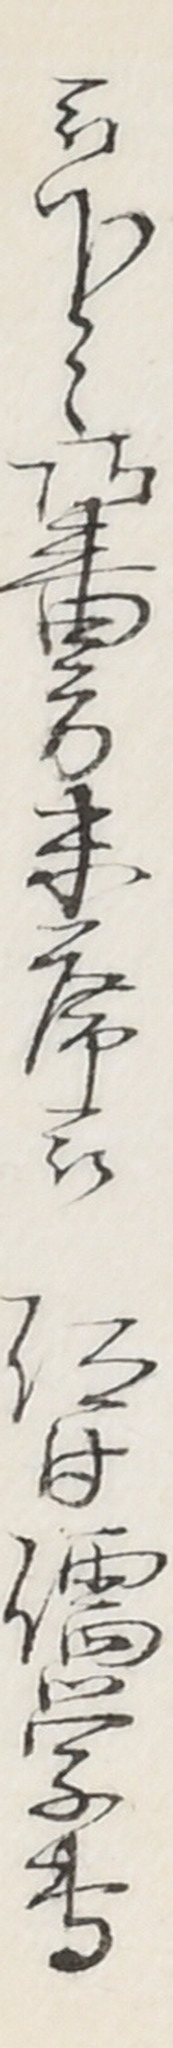被下之御番方末席被仰付儒学専
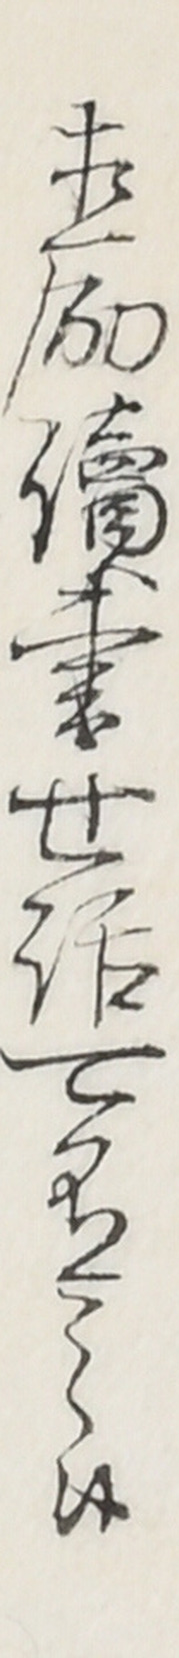相励読書世話可有之候
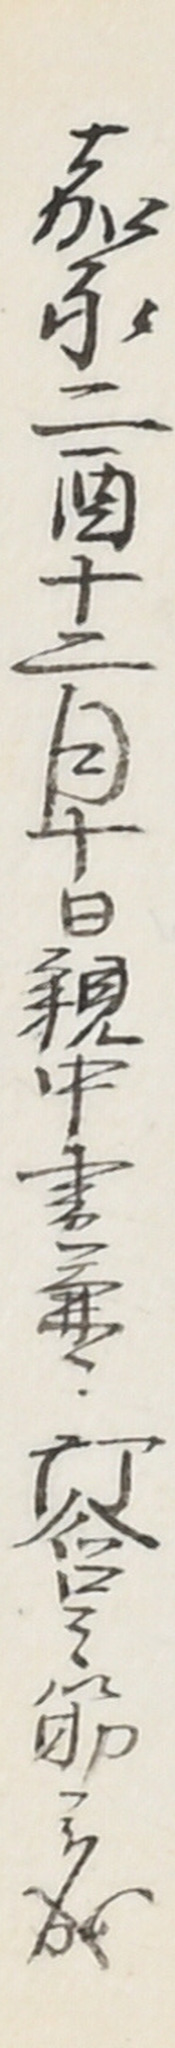一嘉永二酉十二月十日親中書兼々御含之筋被成
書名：給人諸士勤仕録（七）
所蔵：伊那市立高遠町図書館・合同会社AMANE
